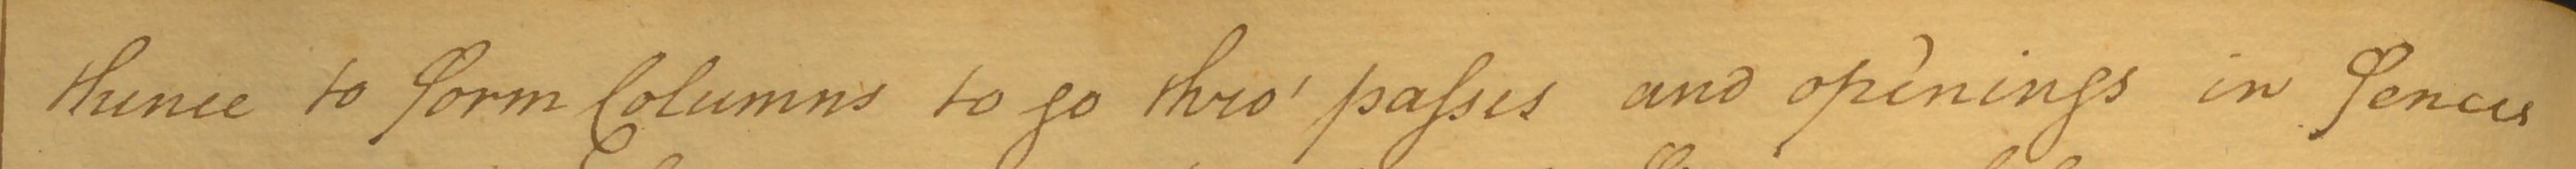thence to form Columns to go thro' passes and openings in fences
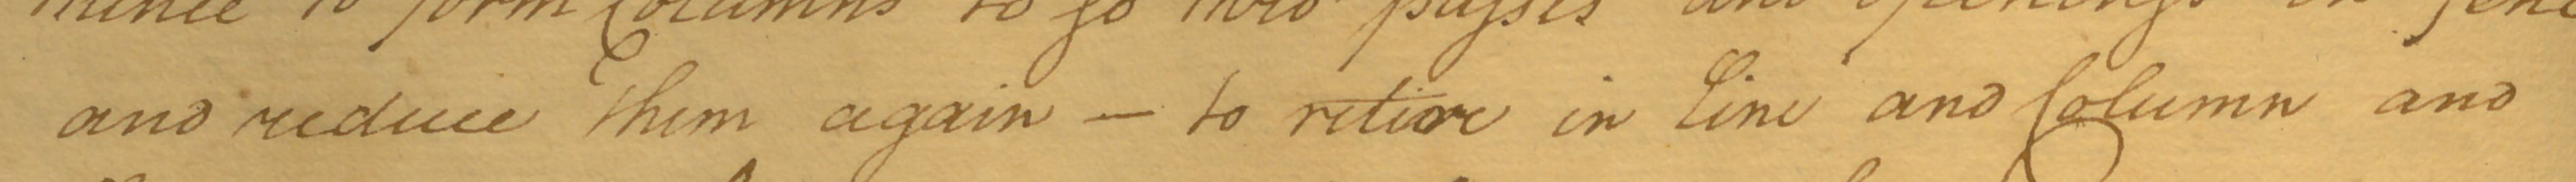and reduce them again- to retire in line and Column and
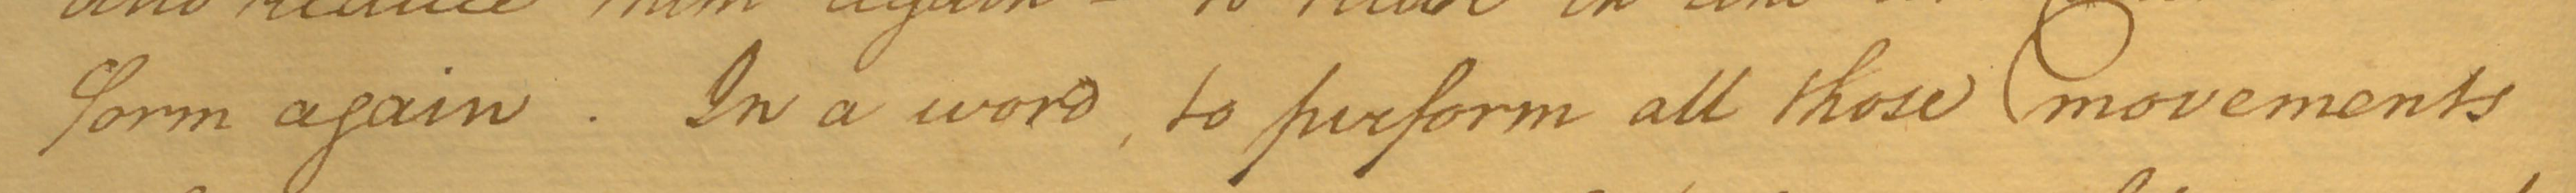form again. In a word, to perform all those movements
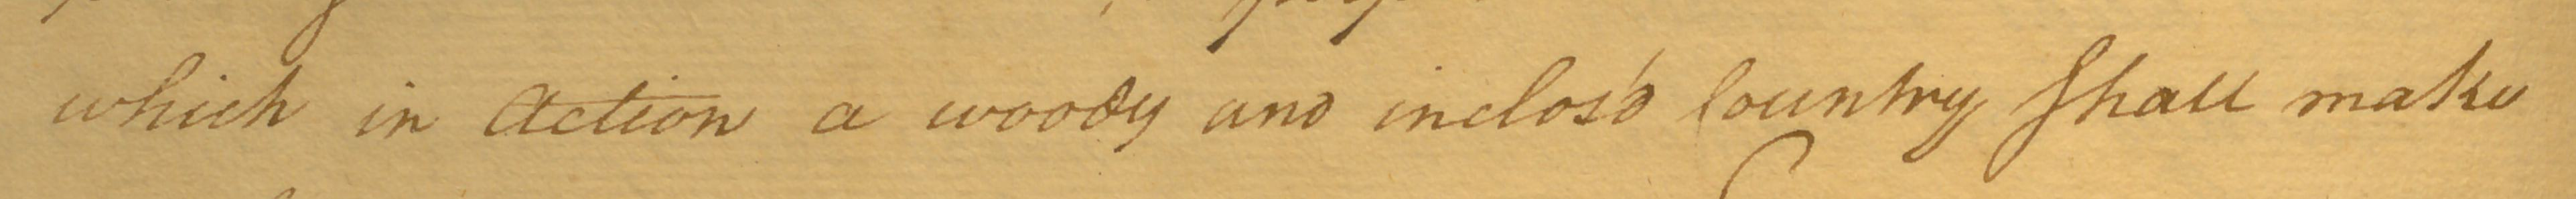which in Action a woody and inclos'd country shall make
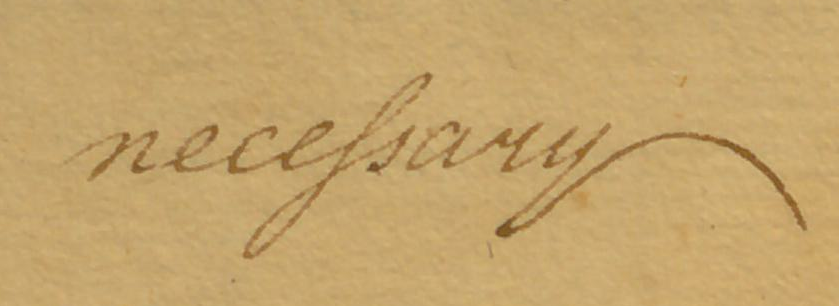necessary
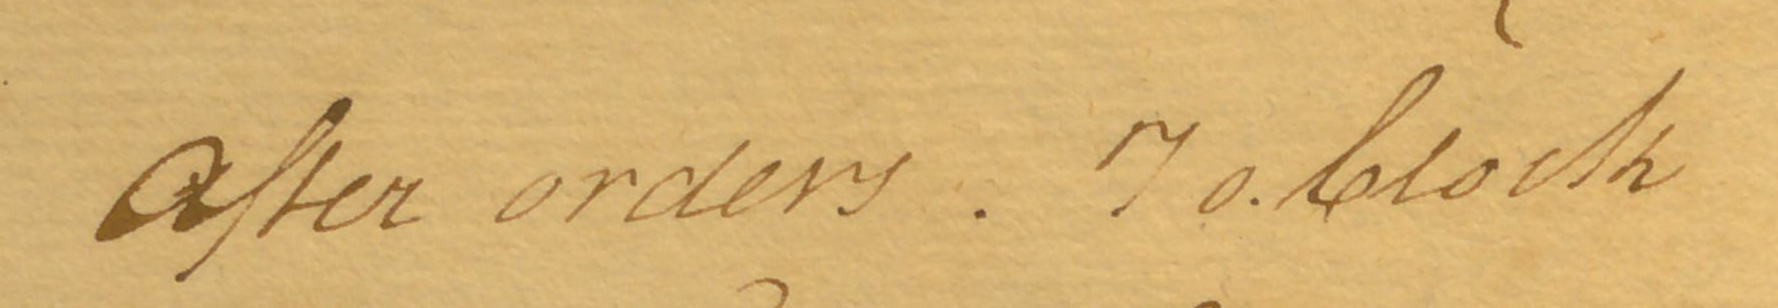after orders. 7 o.Clock
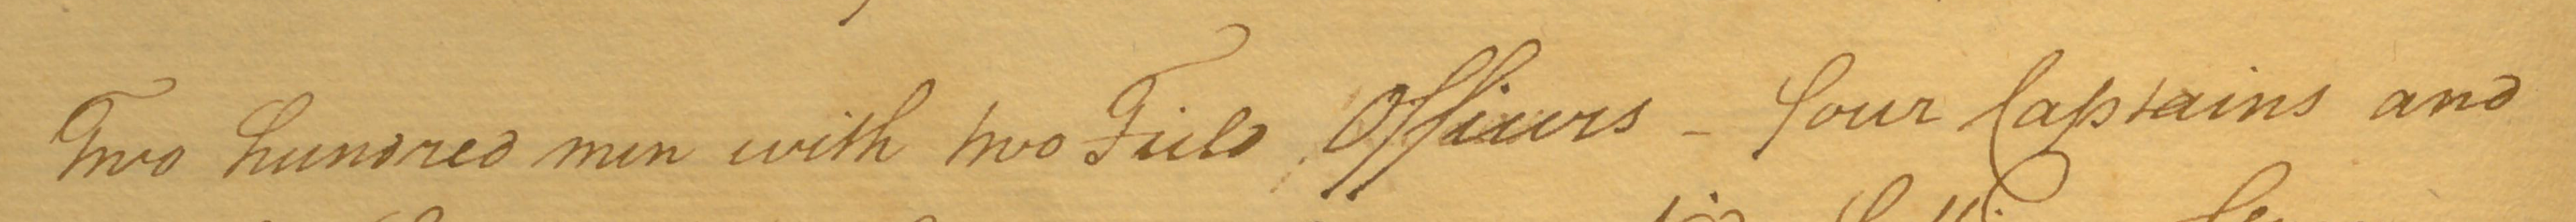Two hundred men with two Field Officers- four Captains and
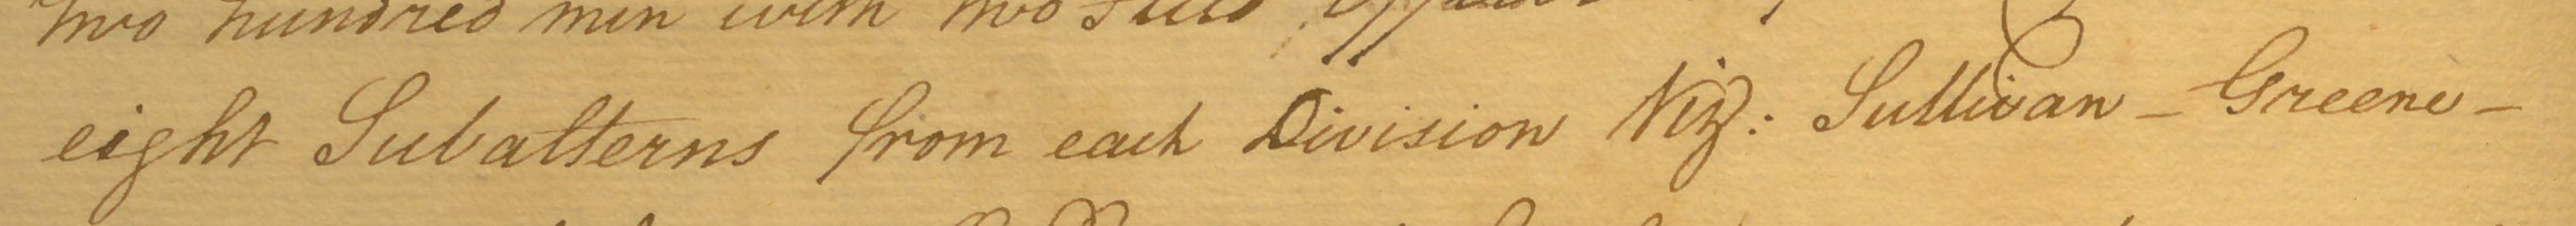eight Subalterns from each Division Viz: Sullivan- Greene-
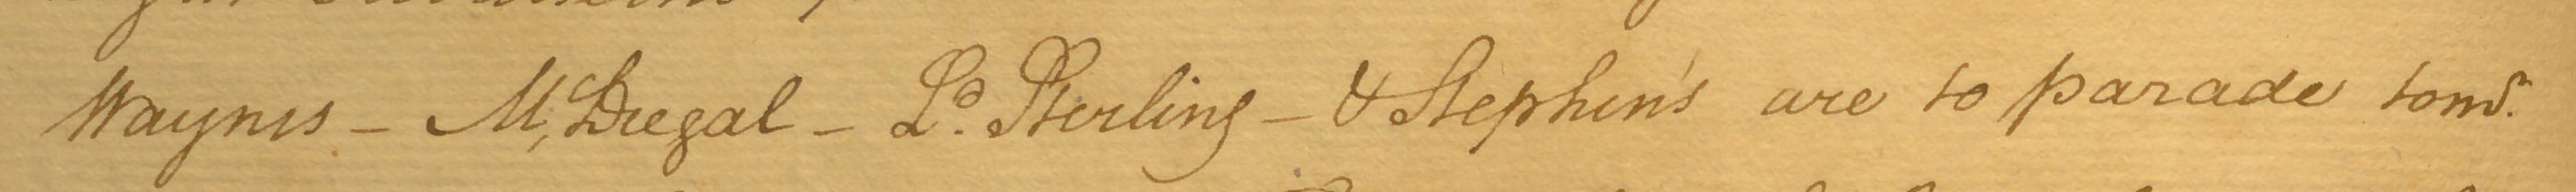Waynes- M^c Dugal- L^d. Sterling- & Stephen's are to parade tom^r.
